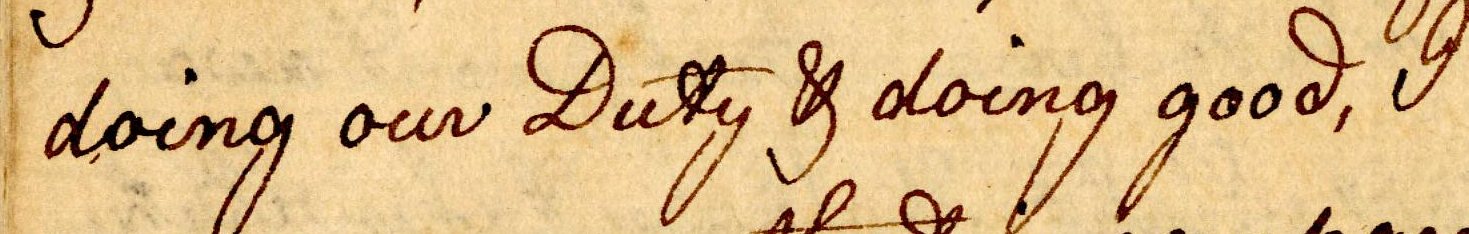doing our Duty & doing good, I
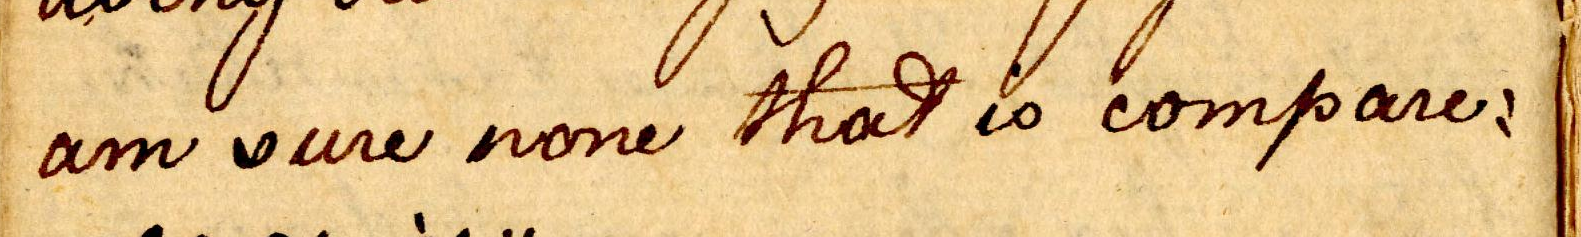am sure none that is compare-
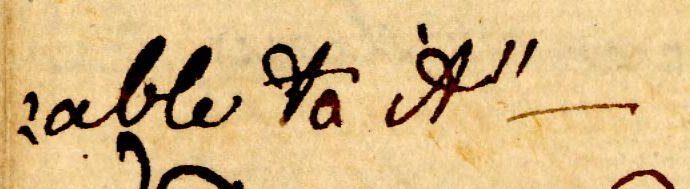-able to it"-
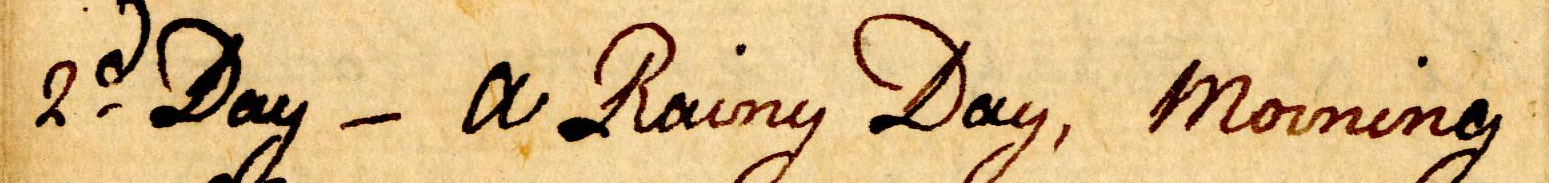2^d. Day- A Rainy Day, Morning
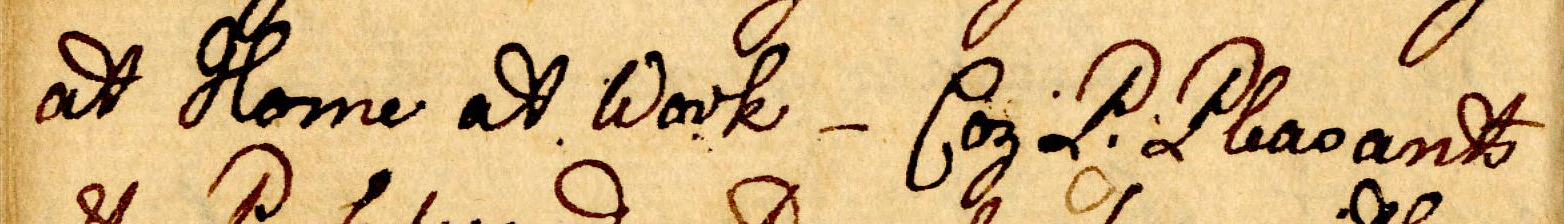at Home at Work- Coz P. Pleasants
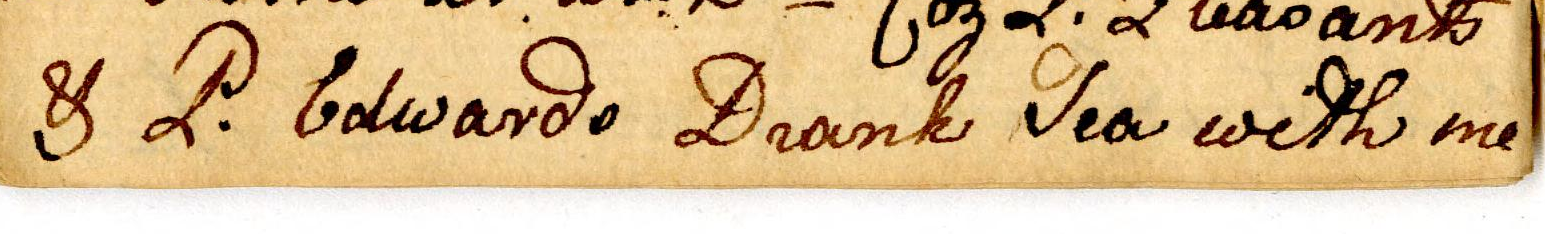& P. Edwards Drank Tea with me
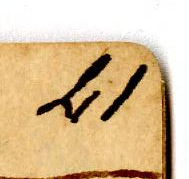41
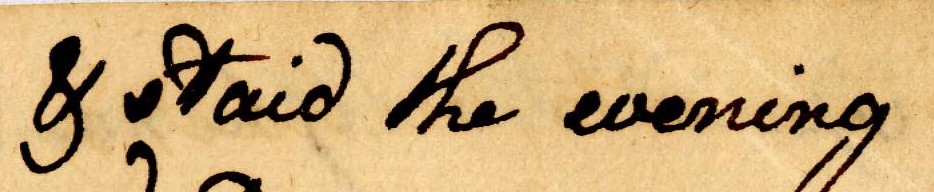& staid the evening
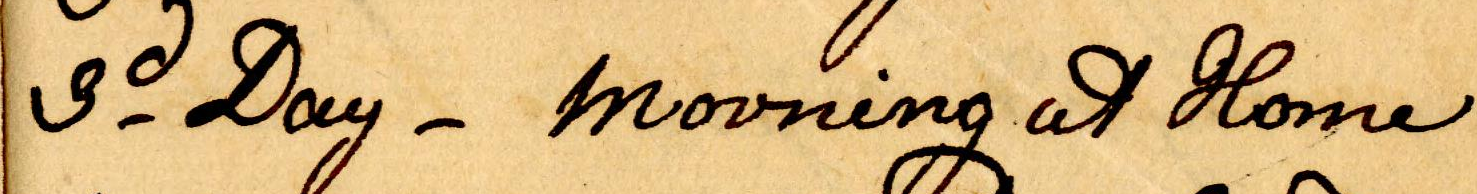3^d Day- Morning at Home
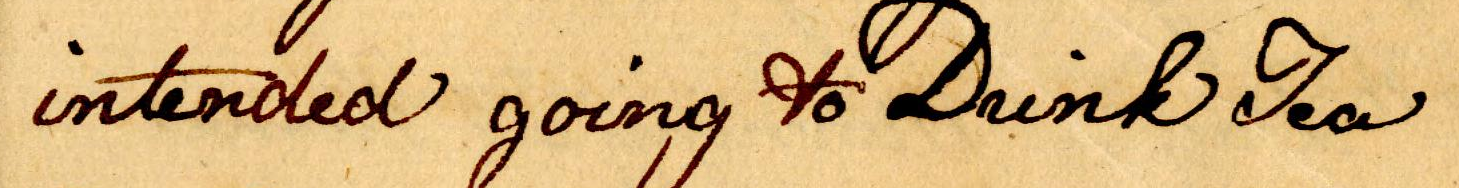intended going to Drink Tea
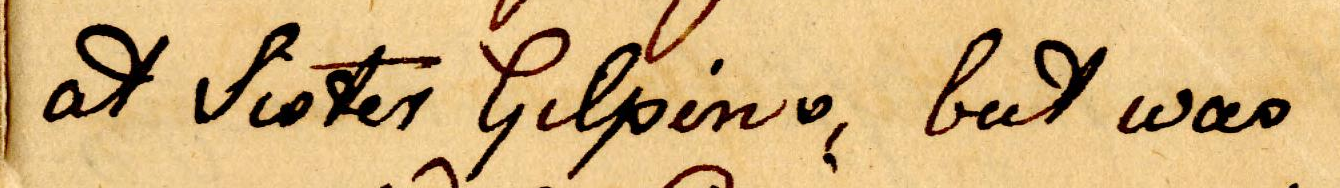as Sister Gilpins, but was
